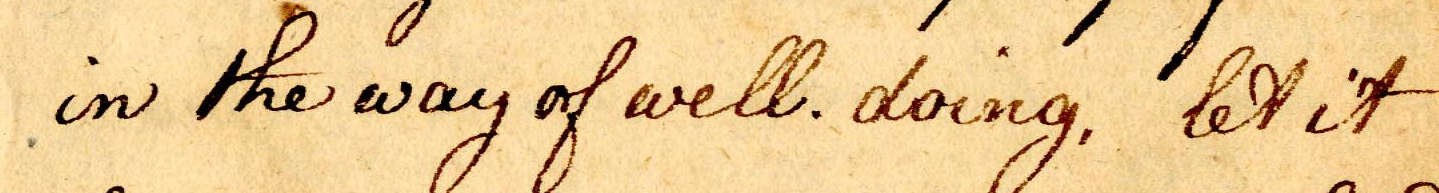int the way of well. doing, let it
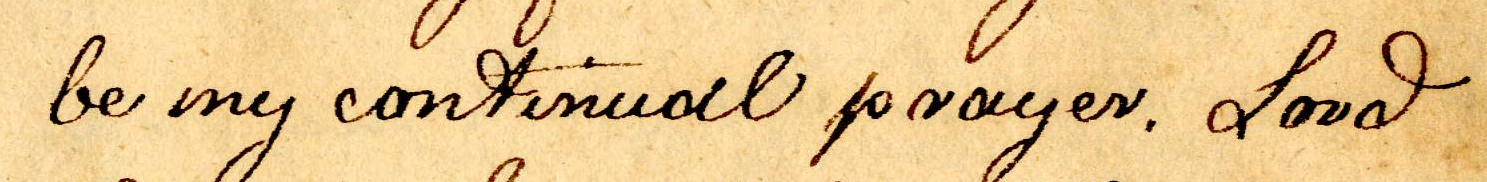be my continual prayer. Lord
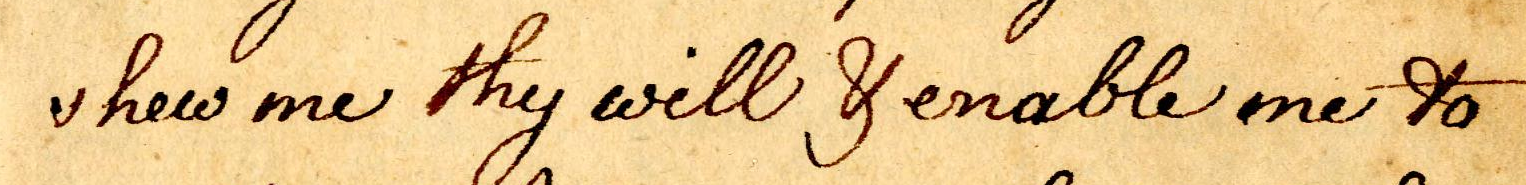shew me thy will & enable me to
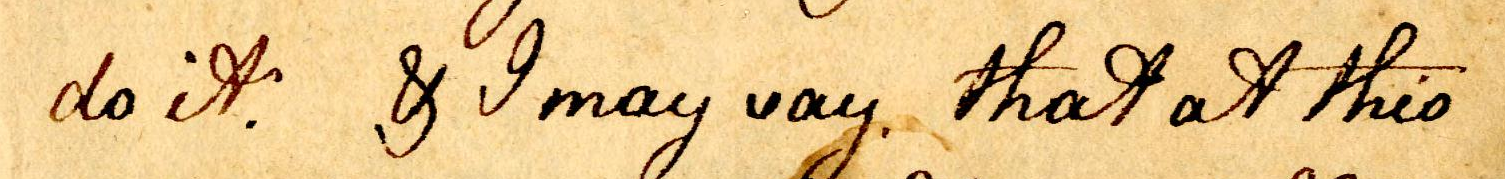do it. & I may say, that at this
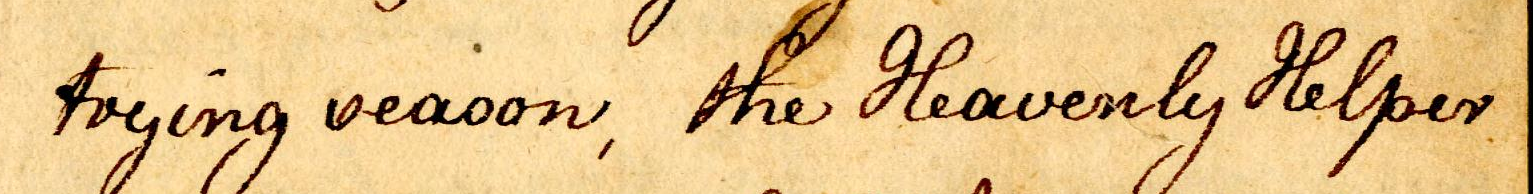trying season, the Heavenly Helper
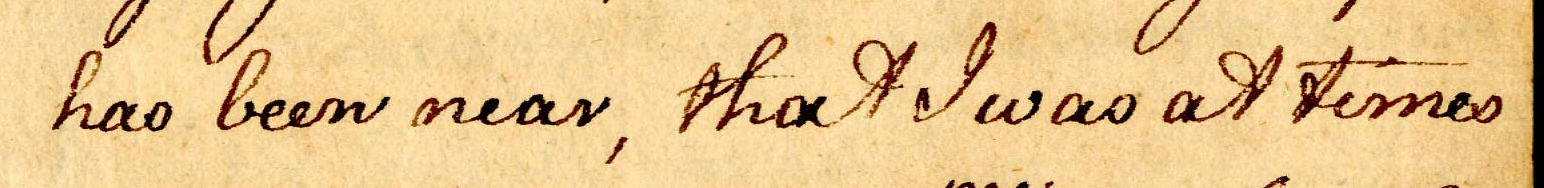has been near, that I was at times
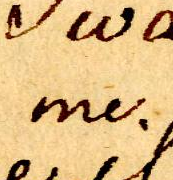me
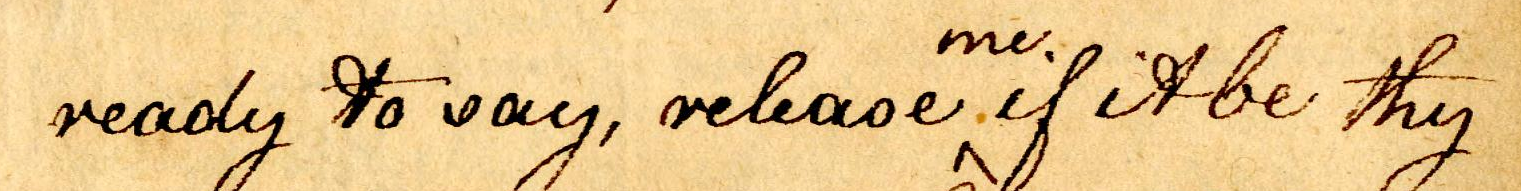ready to say, release ^ if it be thy
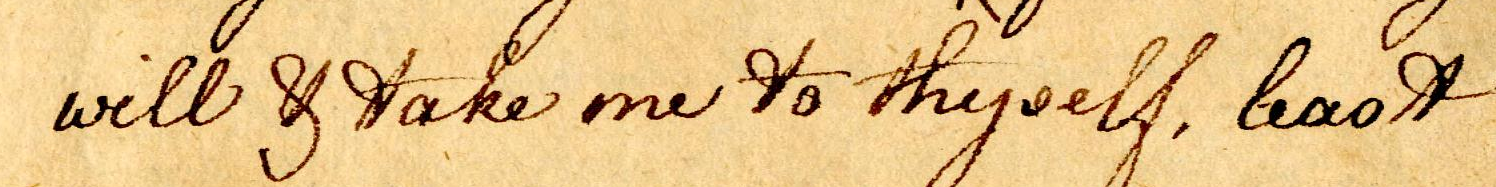will & take me thyself, least
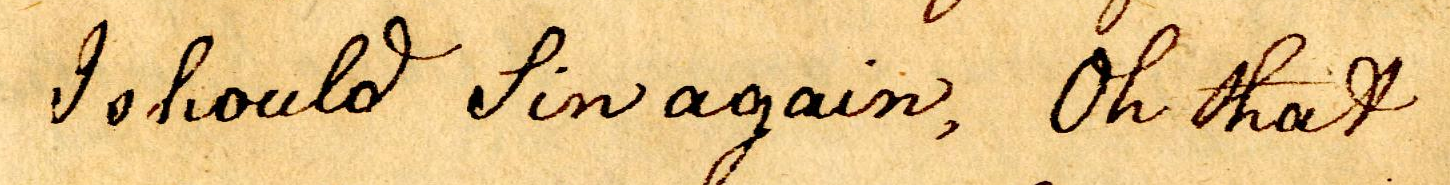I should Sin again, Oh that
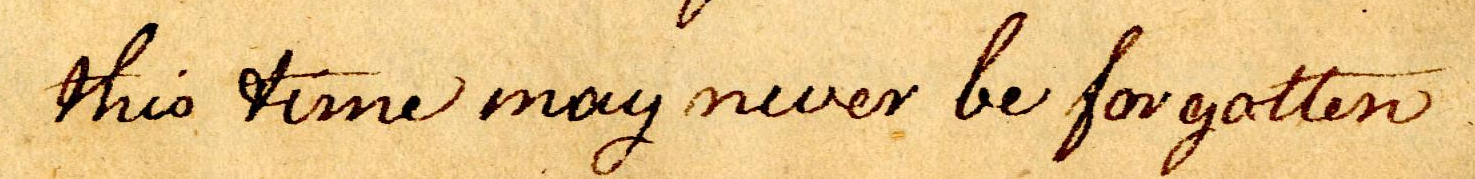this time may never be forgotten
